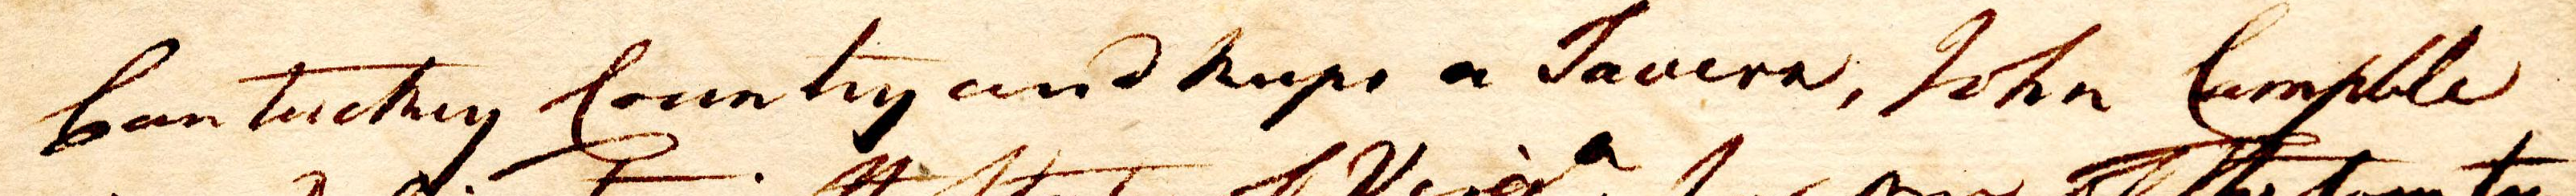Cantuckey Country and hope a Tavern, John Campble
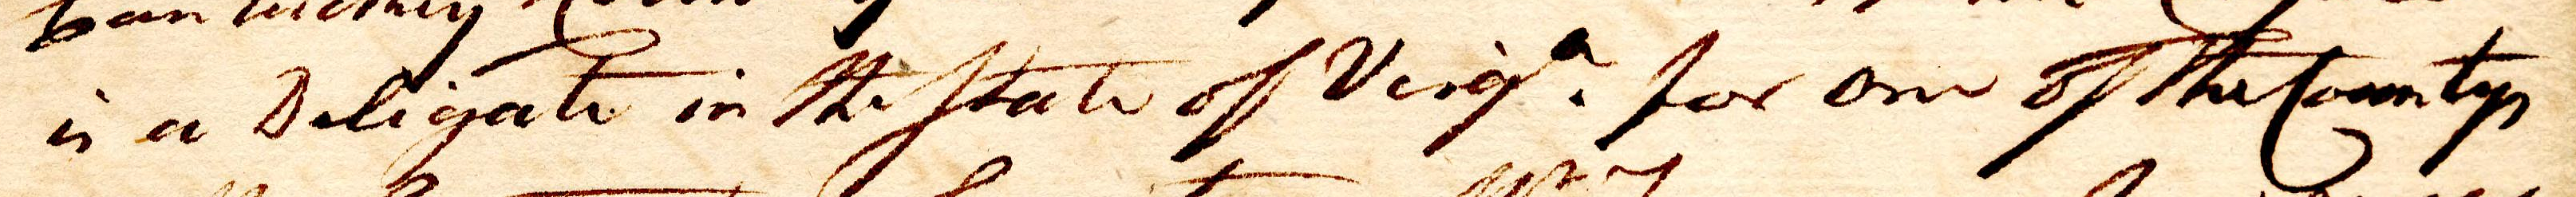is a Deligate in the state of Virg^a. for one of the Countys
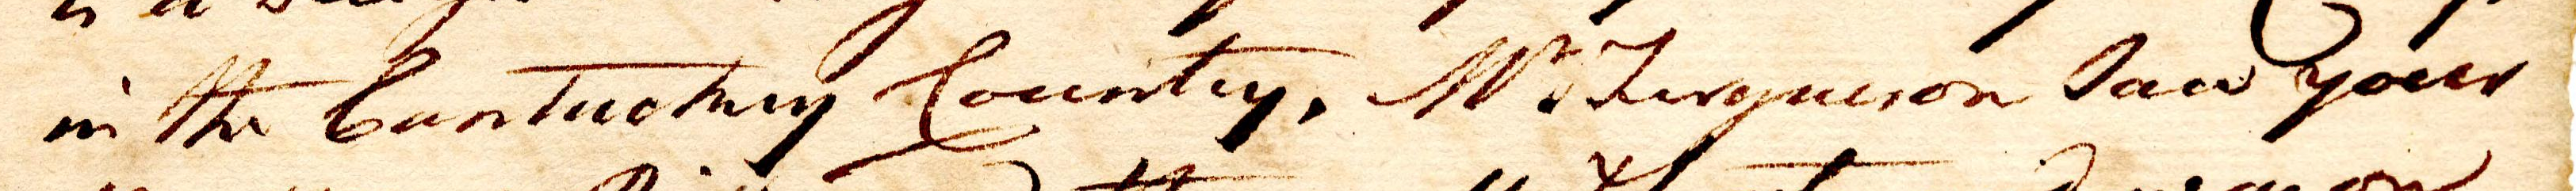in the Cantuckey Country, M^r. Ferguson Saw Your
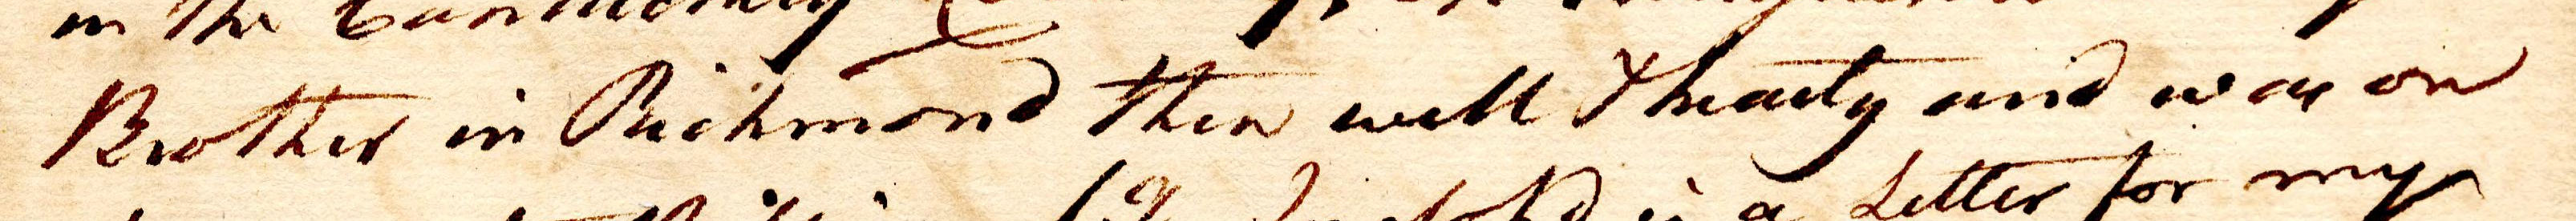Brother in Richmond then well & hearty and was on
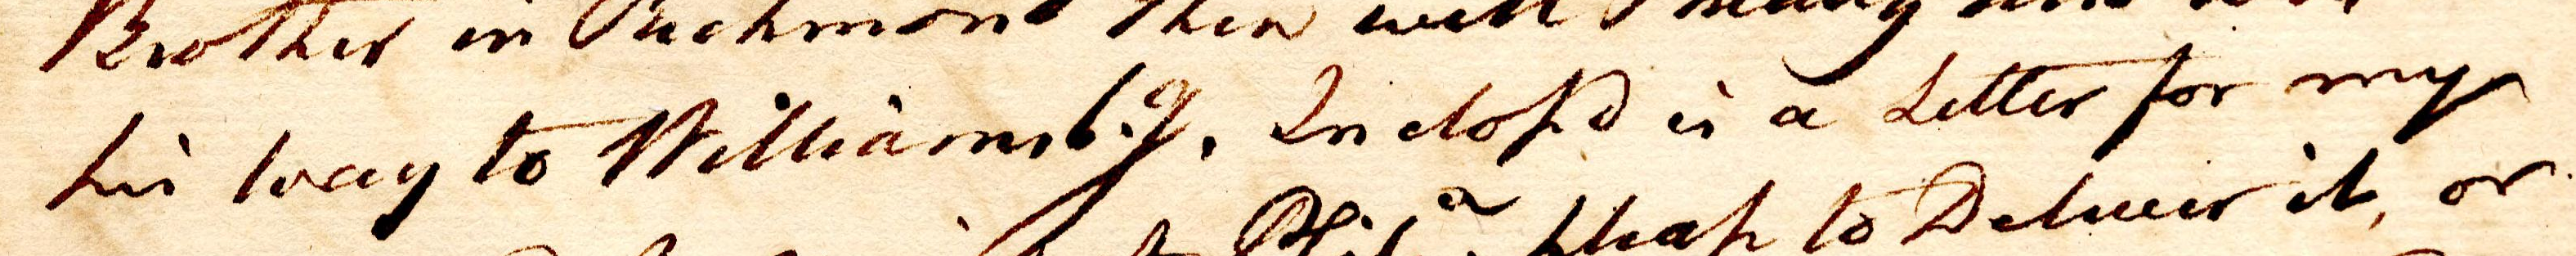his way to Williamsb^g. In clos'd is a Letter for my
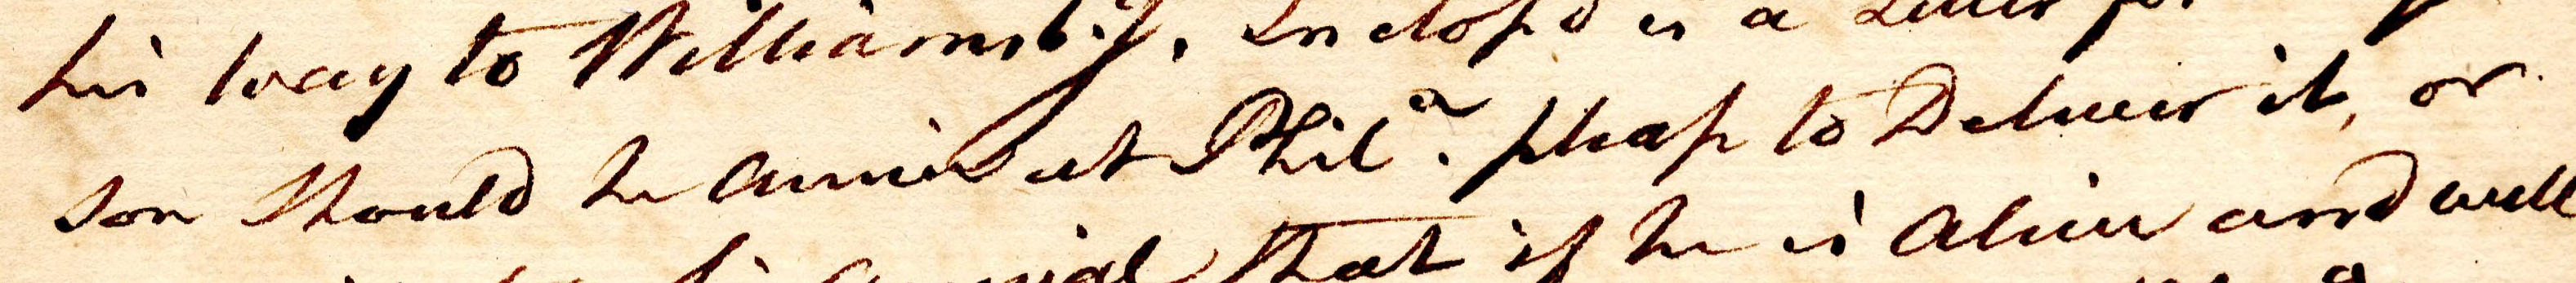son should he arrive at Phil^a please to Deliver it, or
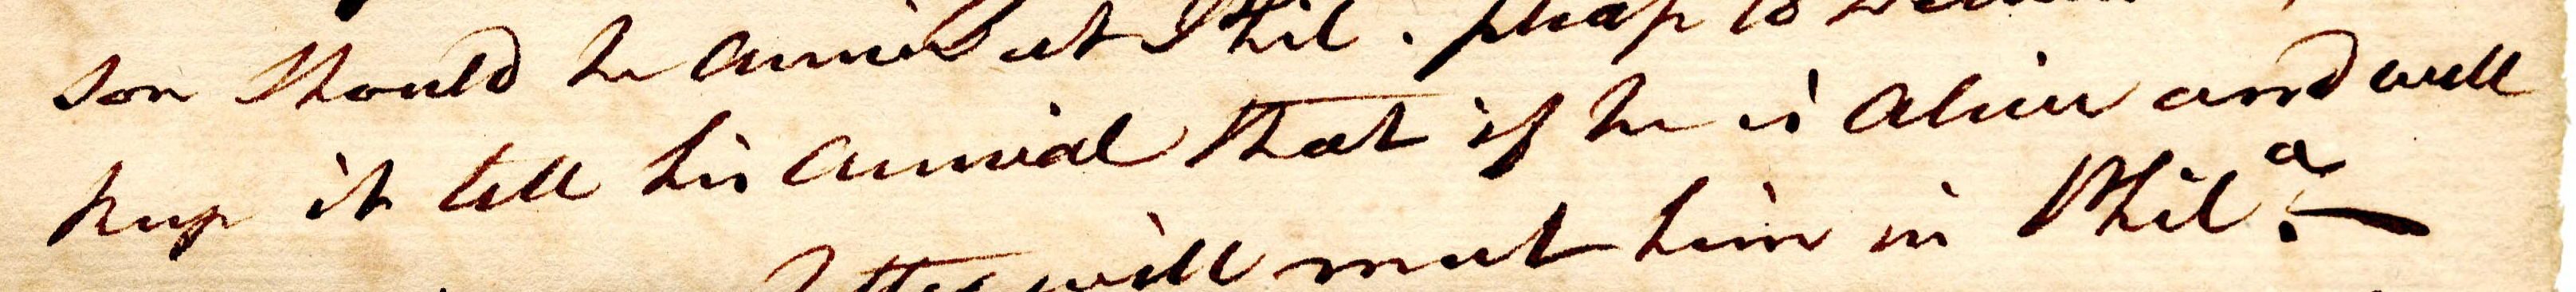keep it till his Arrival that if he is alive and well
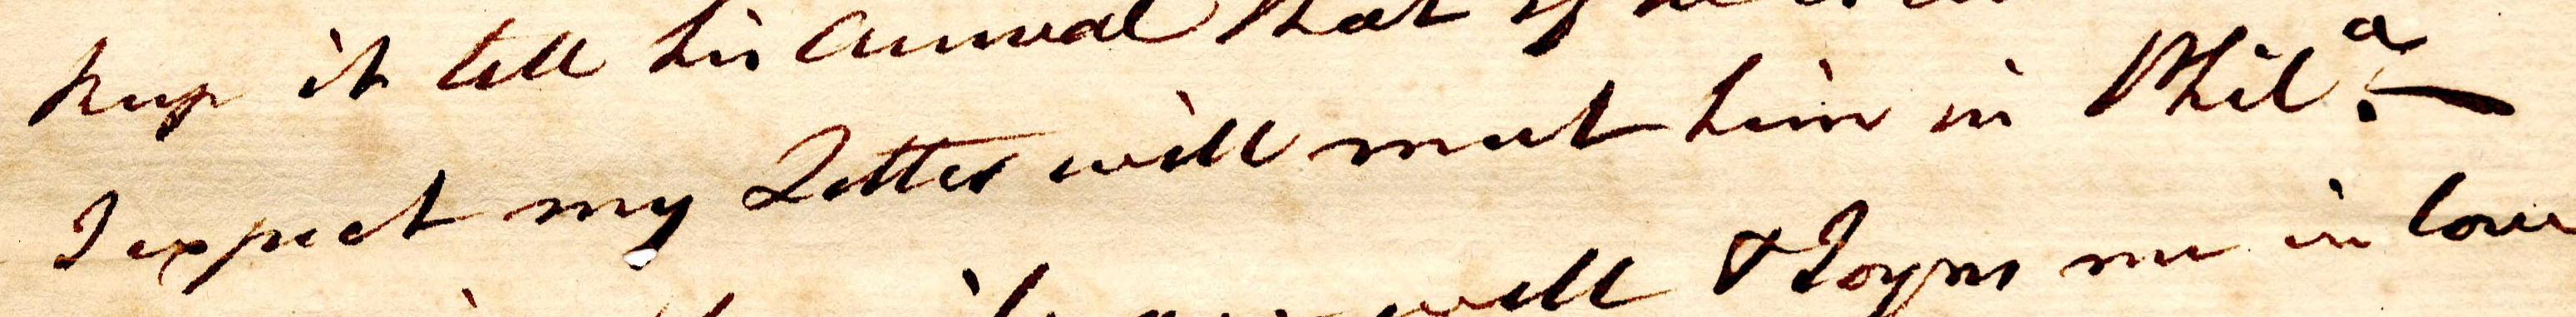I expect my Letter will meet him in Phil^a.-
